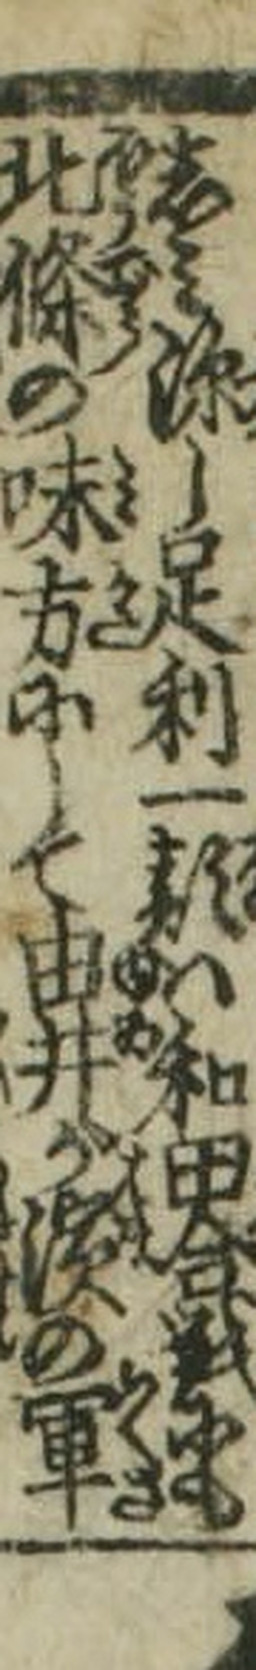北条の味方にして由井が浜の軍
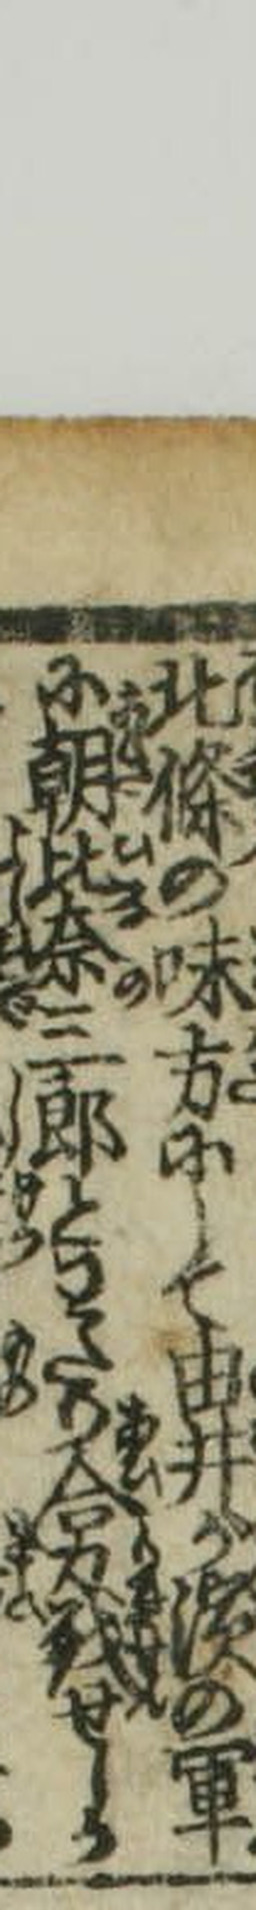に朝比奈三郎とわたり合力戦せしか
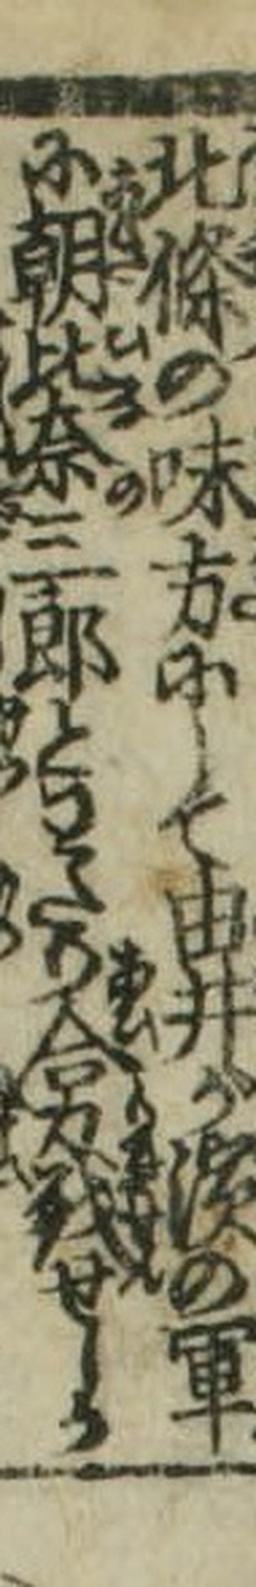に朝比奈三郎とわたり合力戦せしか
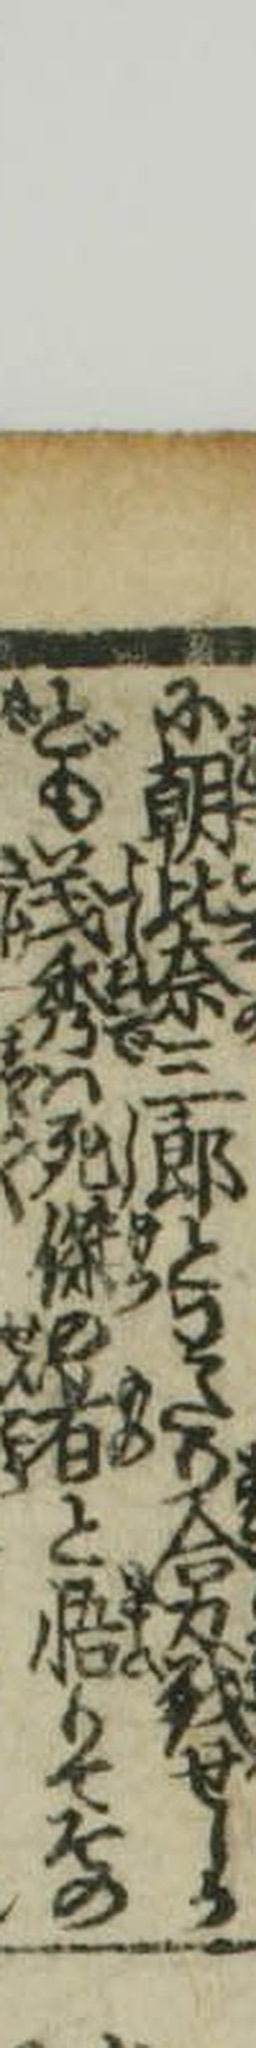ども義秀は死傑の者と悟りてその
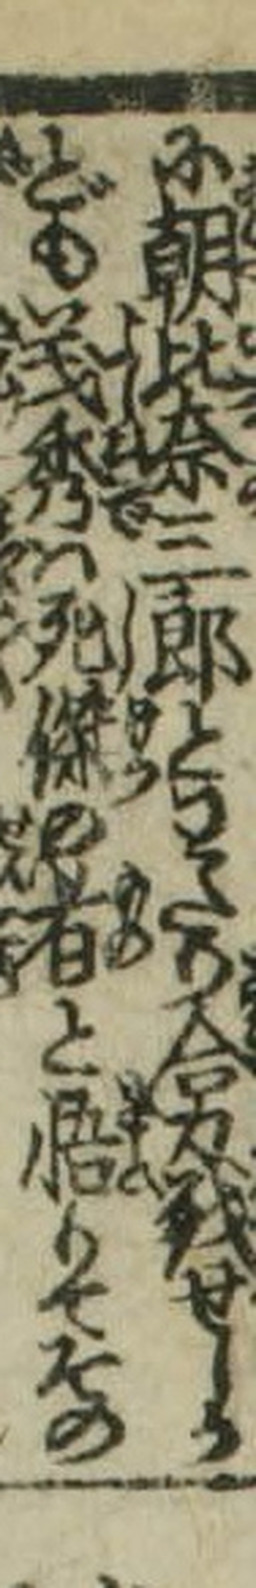ども義秀は死傑の者と悟りてその
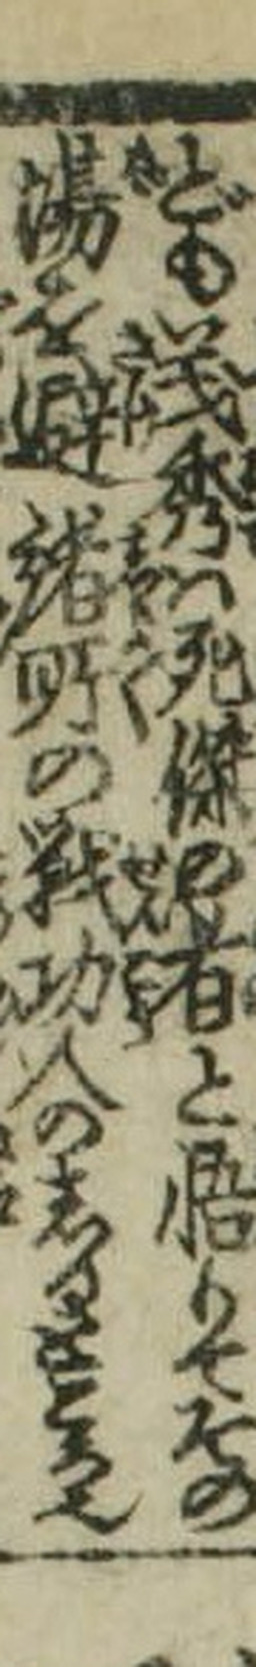場を避諸所の戦功人のしるところ也
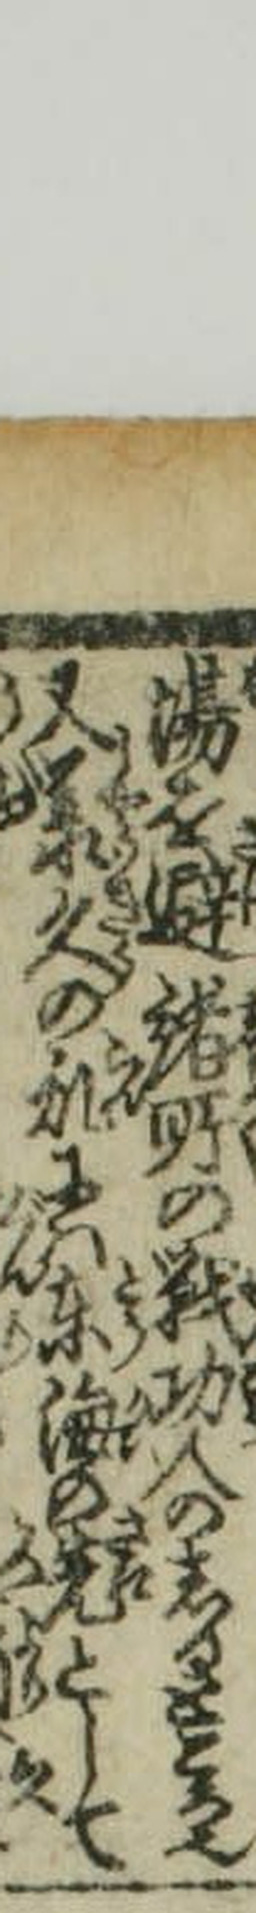又承久の乱には東海の先として
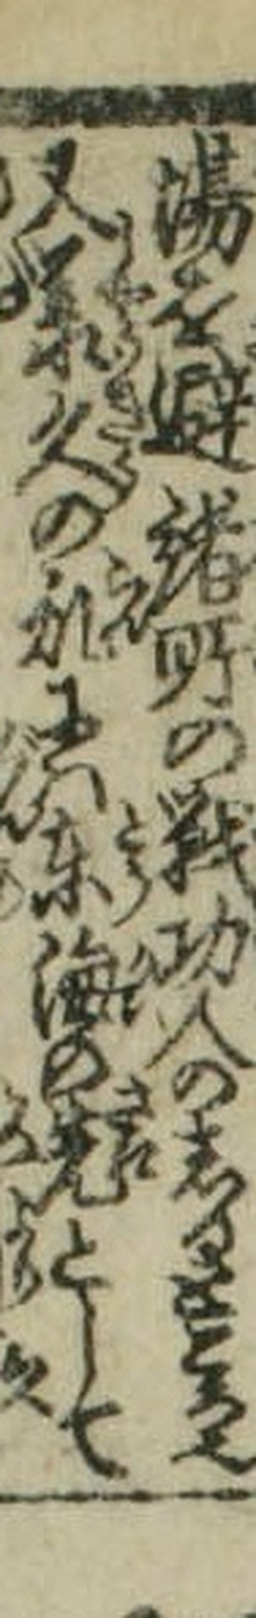又承久の乱には東海の先として
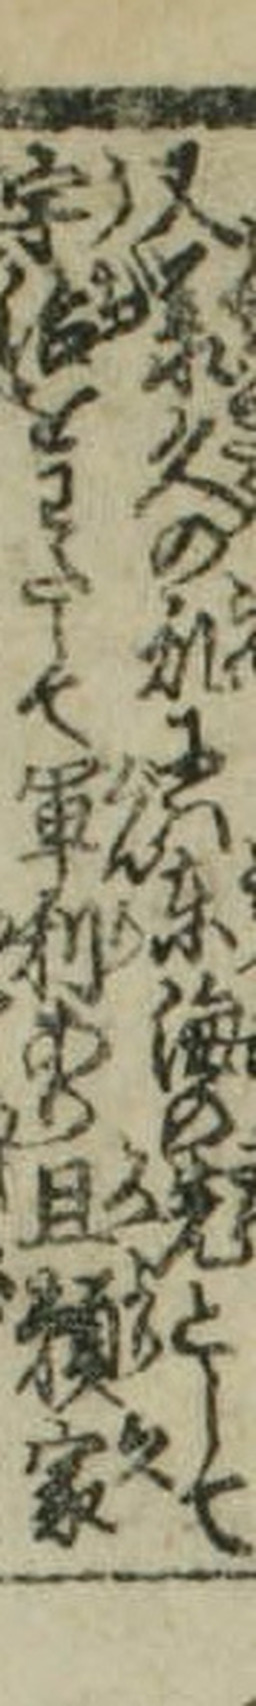宇治をわたして軍利あり且頼家
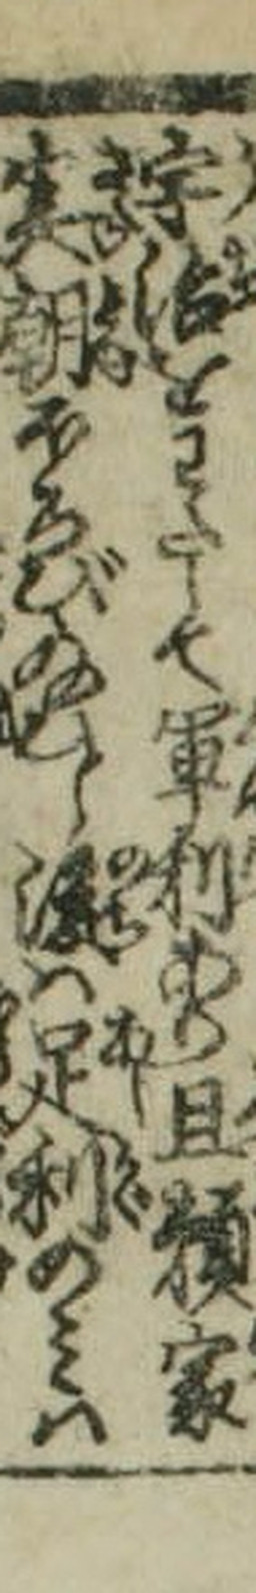実朝ほろび給ひし後は足利のみは
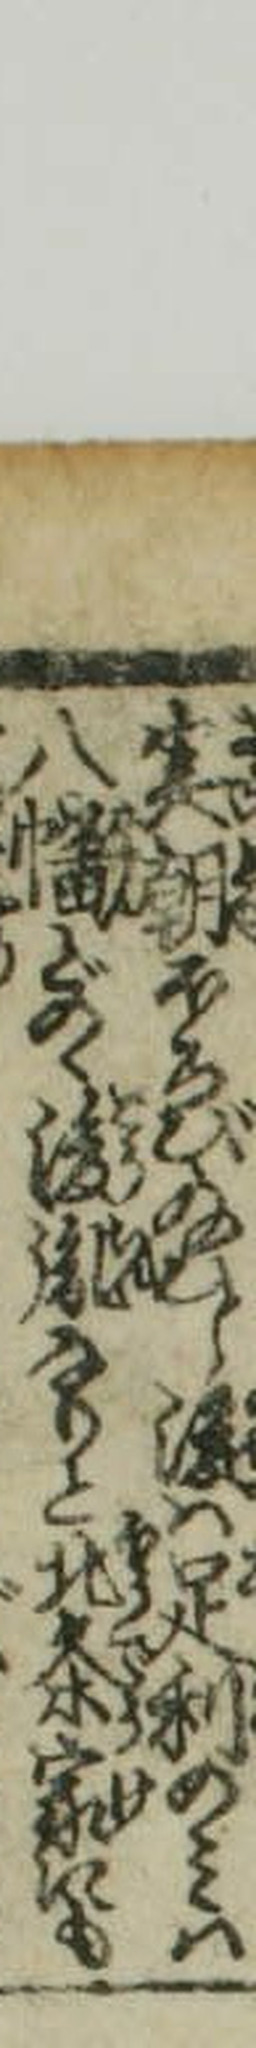八幡どのゝ後胤なりと北条家にも
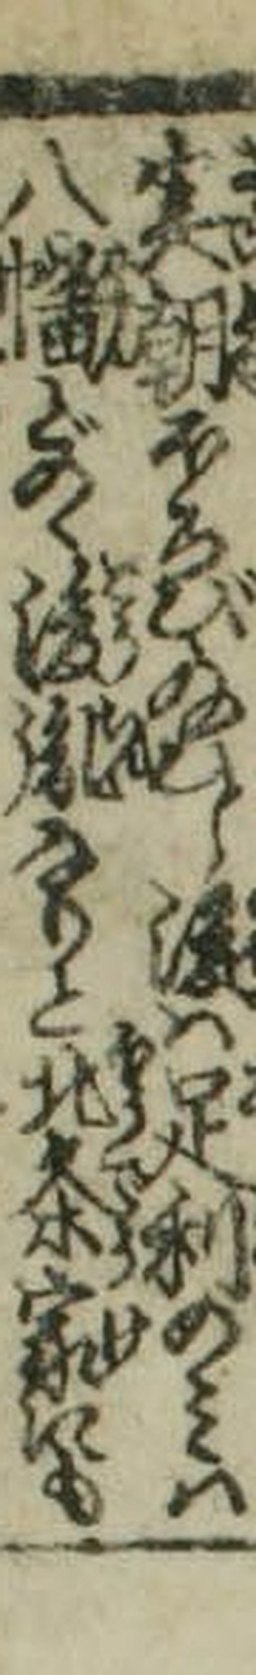八幡どのゝ後胤なりと北条家にも
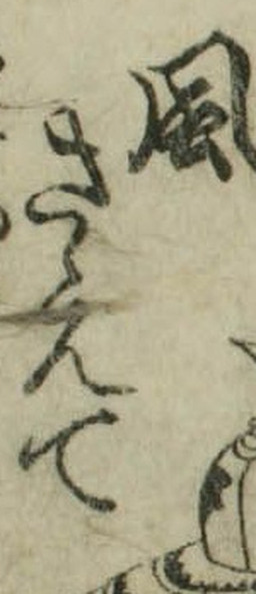さえて
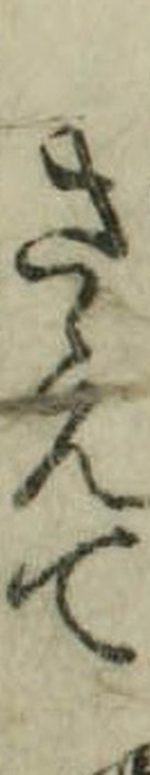さえて
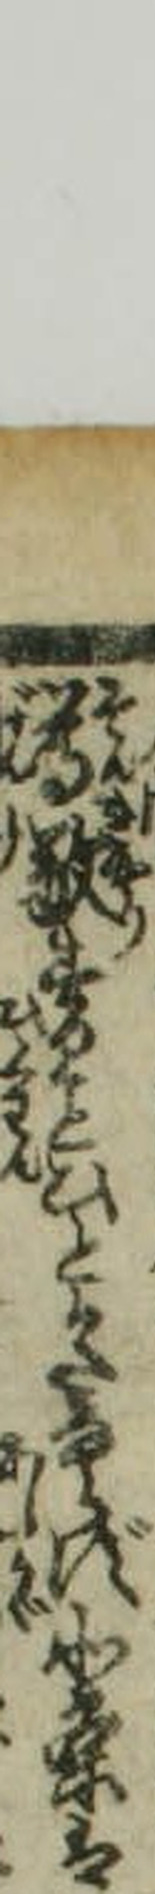尊敬することひとかたならず北条は
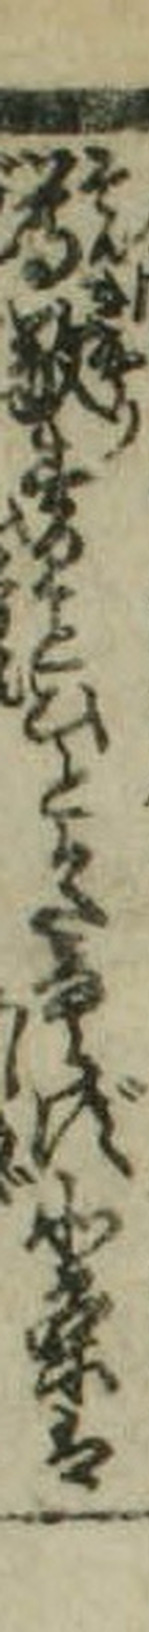尊敬することひとかたならず北条は
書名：續英雄百人一首
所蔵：東京学芸大学附属図書館
